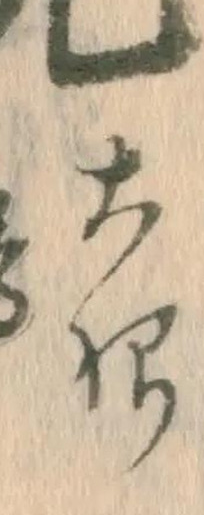椀大根
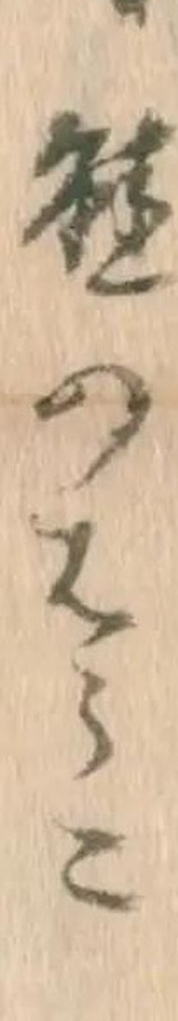鮭のはらこ
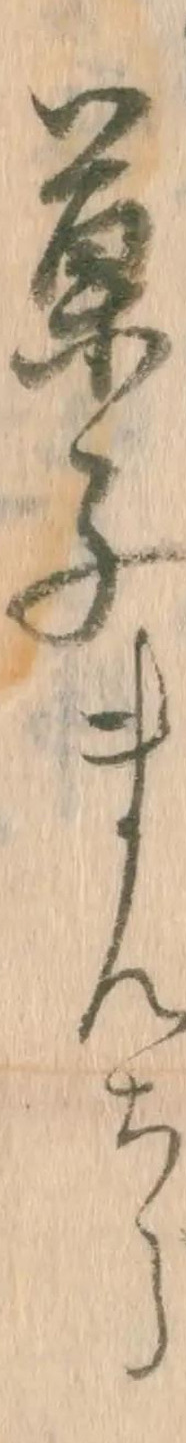菓子まんちう
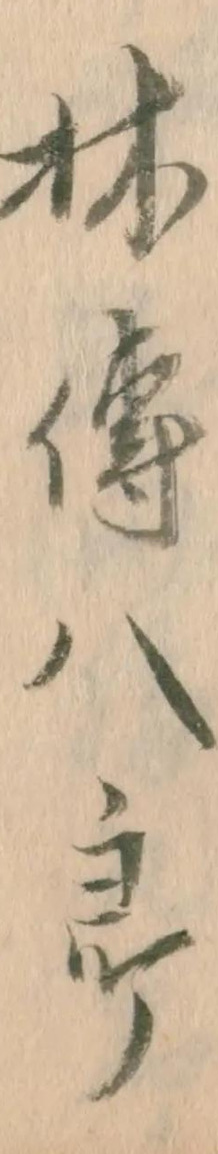林傳八郎
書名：妙喜庵茶事道具料理扣
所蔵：国立国会図書館 National Diet Library, JAPAN
